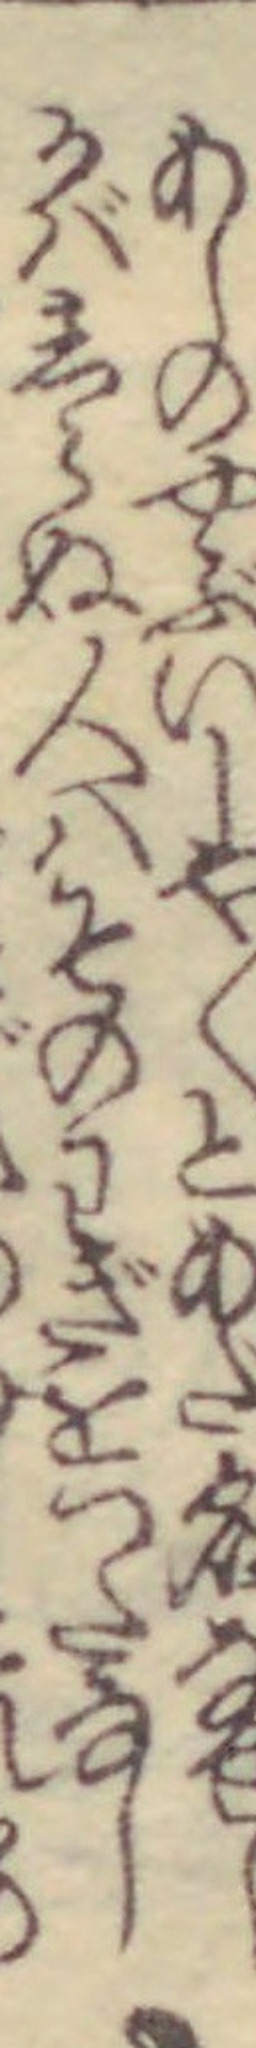かばしらぬ人はそのわざをつたなし
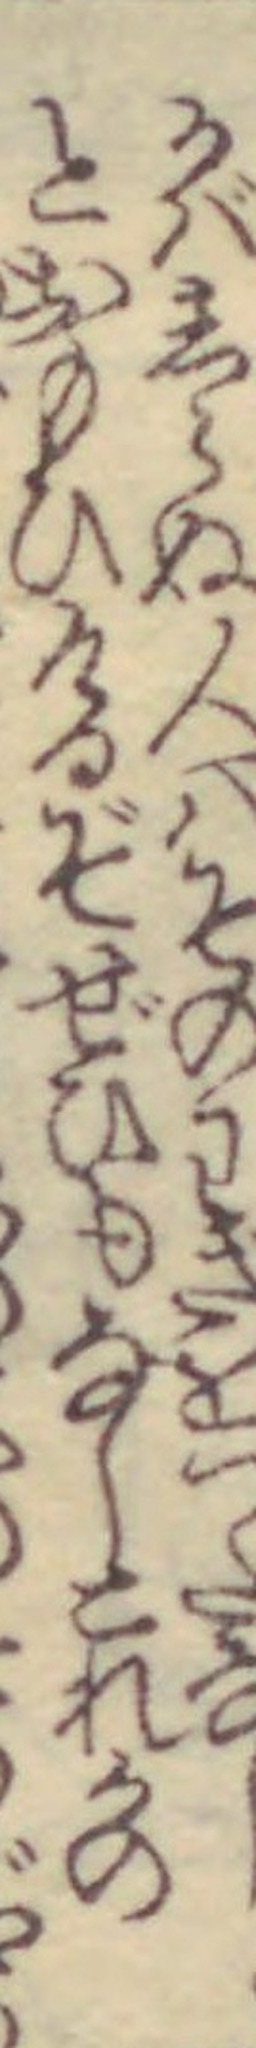とおもひけるぞぜひもなしこれかの
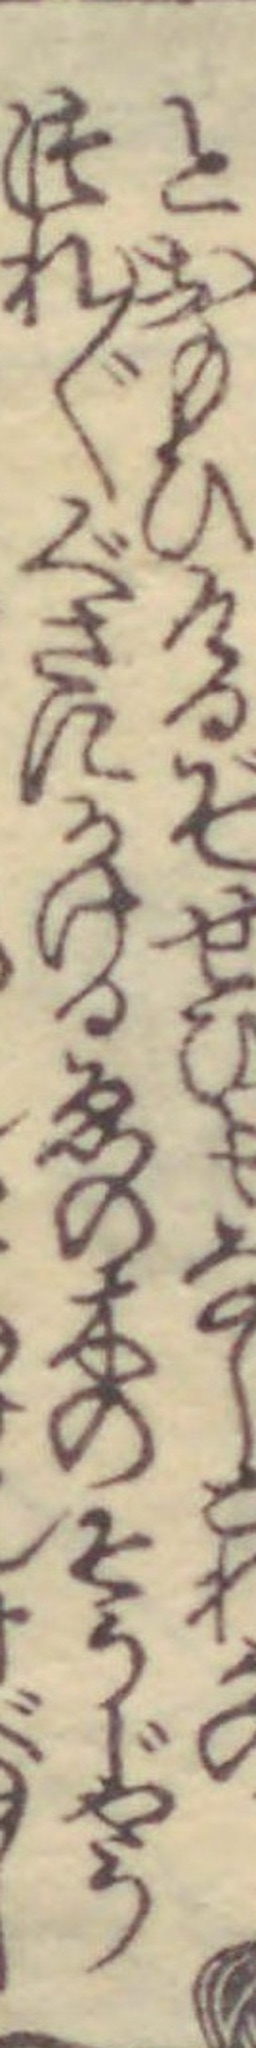つれ〴〵ぐさにかけるゑの木のそうじやう
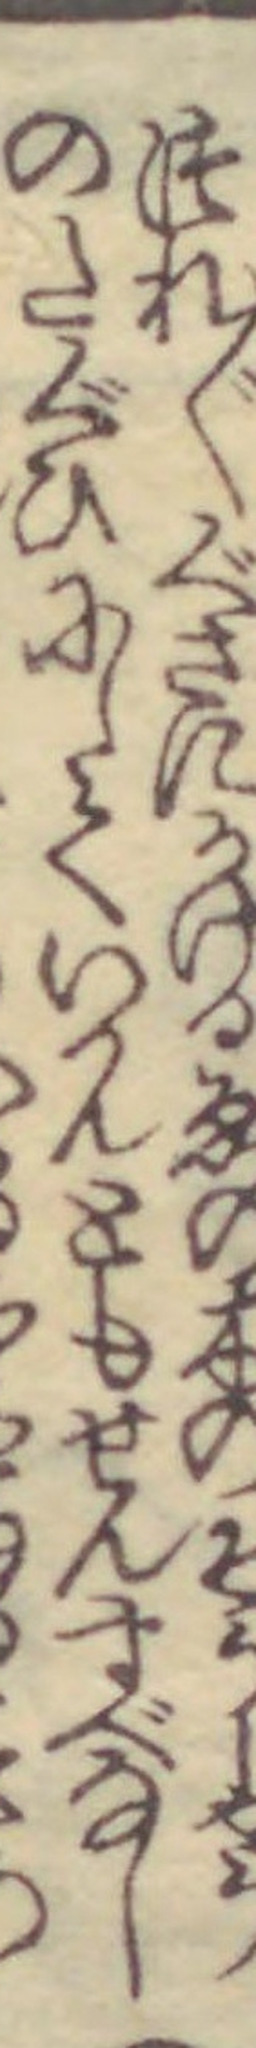のたぐひにしていかんともせんすべなし
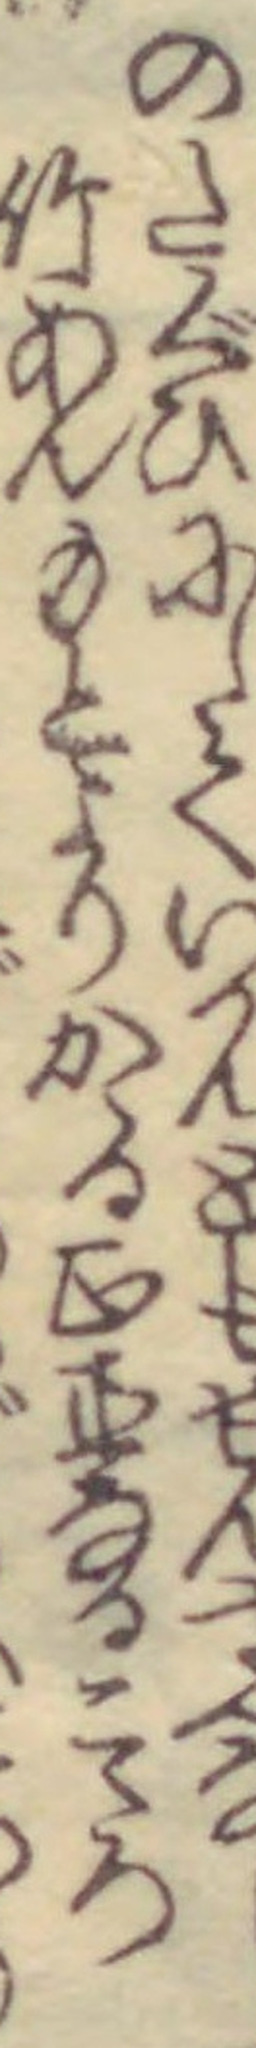竹あんもとよりかゝる正直なるこゝろ
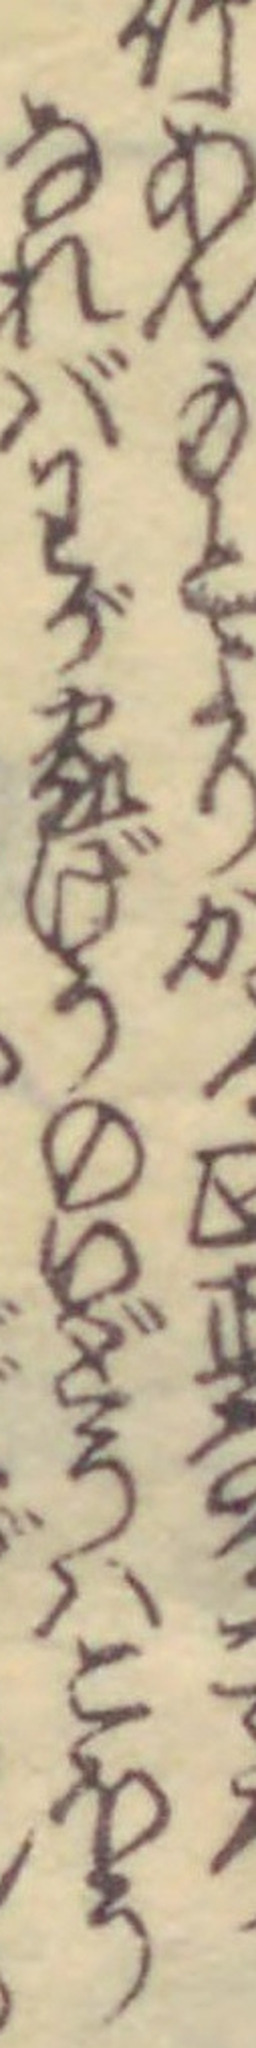なればわが家げうのいどうはこほう
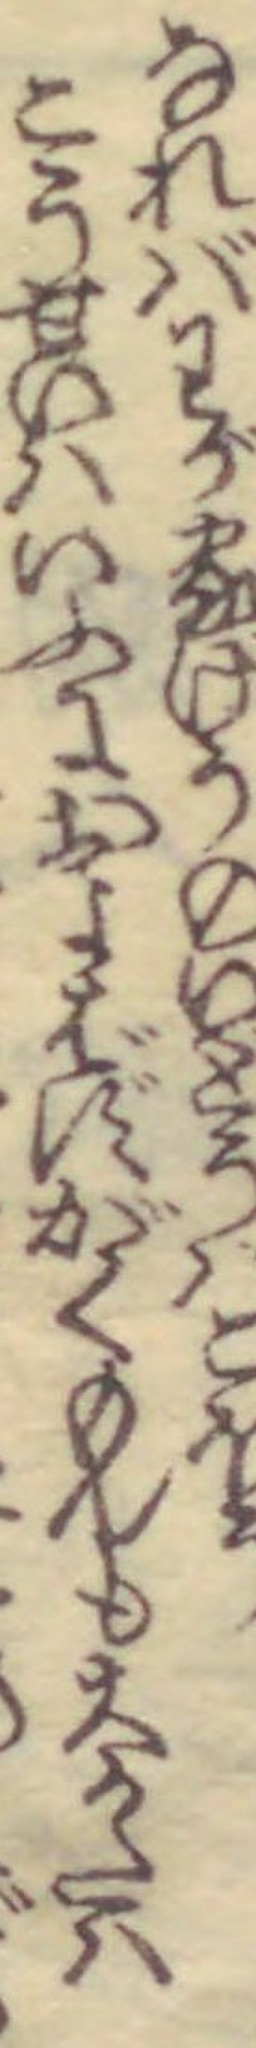こうせいはいふにおよばずがくもんも大かたは
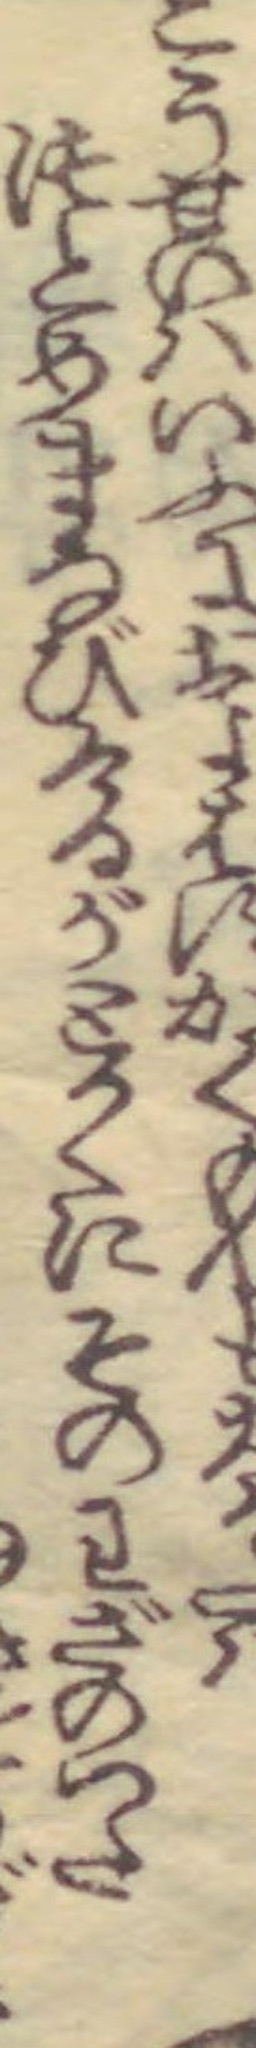つとめまなびけるがとかくにそのわざのつた
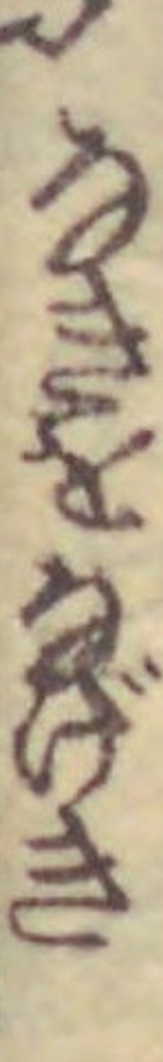なきをなげき
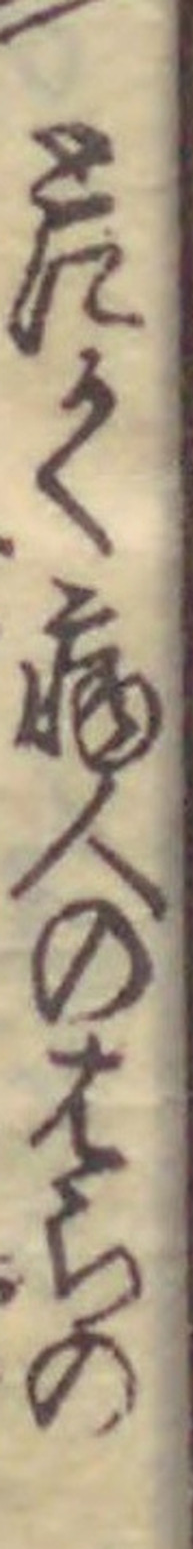とにかく病人のはらの
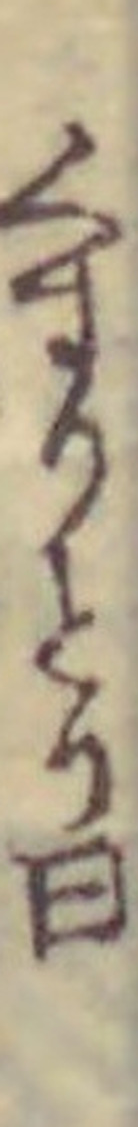くすりとり曰
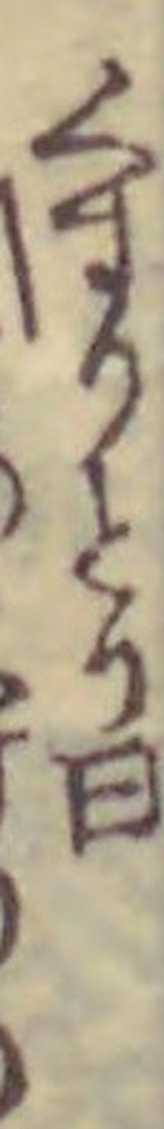くすりとり曰
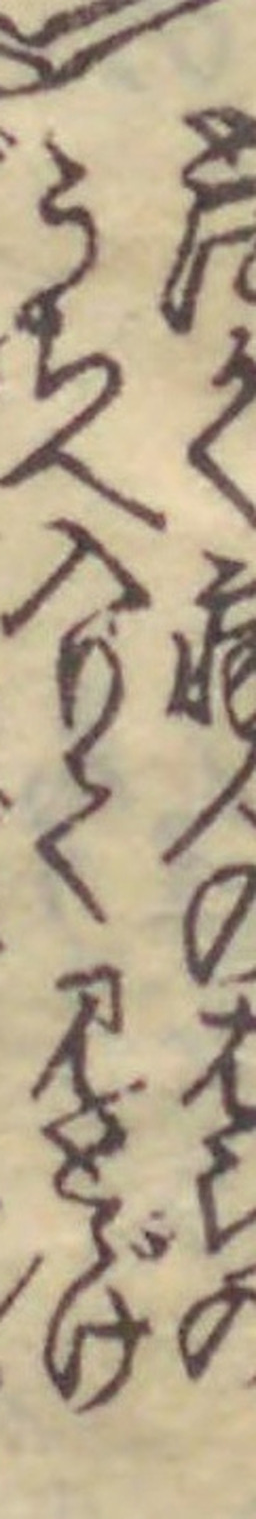うちへ入りて見とゞけ
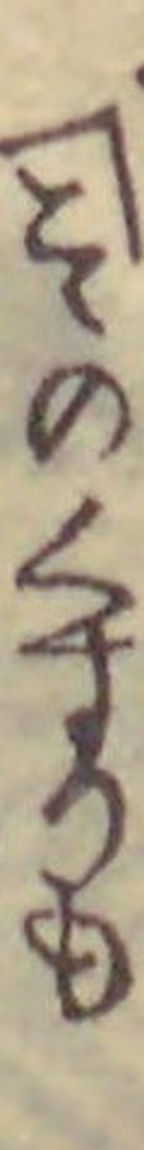〽そのくすりも
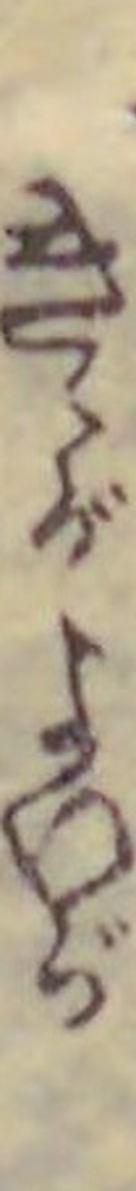きゝがよいが
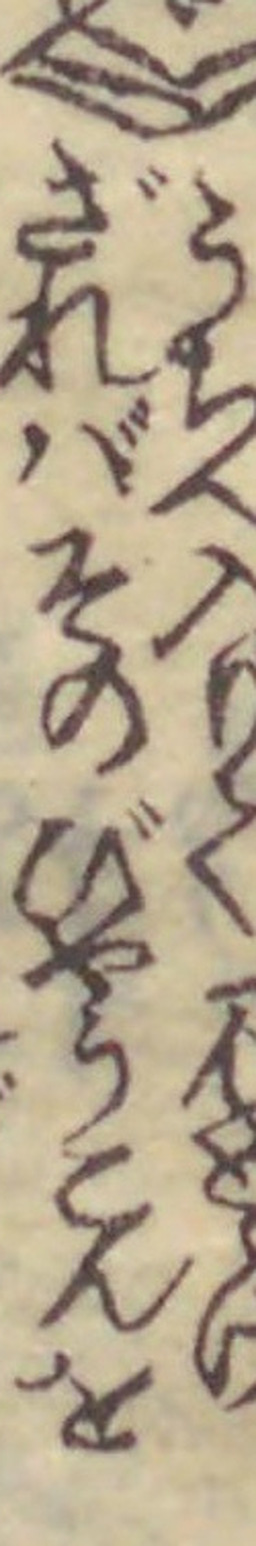ざればそのびやうこんを
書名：腹内窺機関 2巻
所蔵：国立国会図書館 National Diet Library, JAPAN
